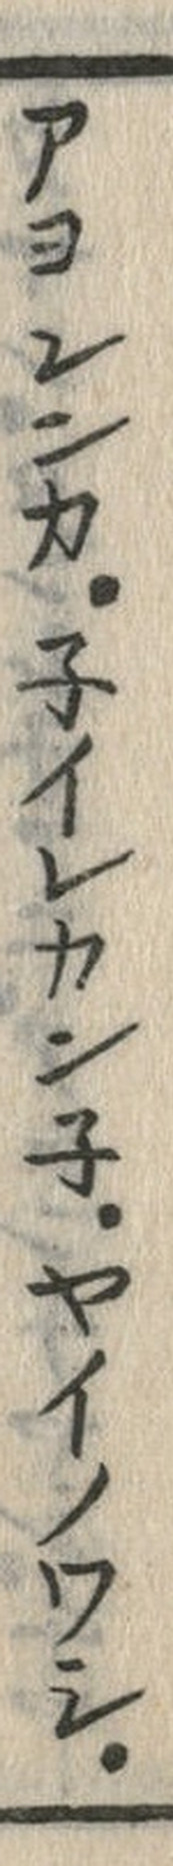アヨレンカ。ネイレカンネ。ヤイノワシ。
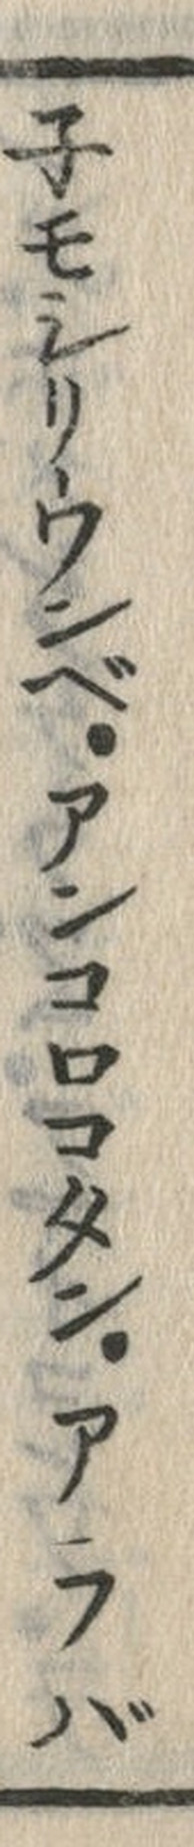ネモシリウンベ。アンコロコタン。アラバ
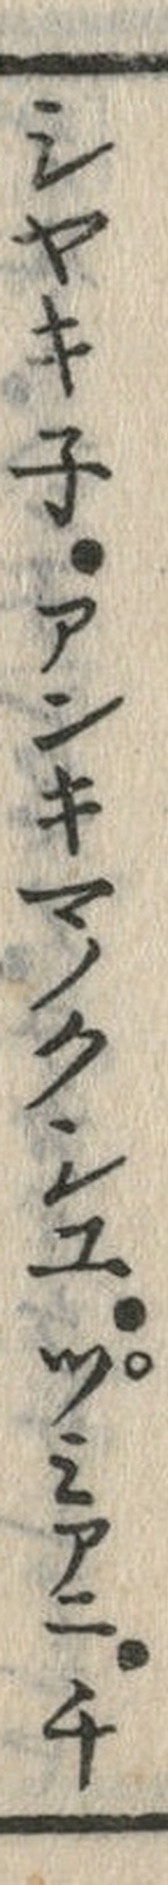シヤキネ。アンキマノクシユ。ツ゚ミアニ。チ
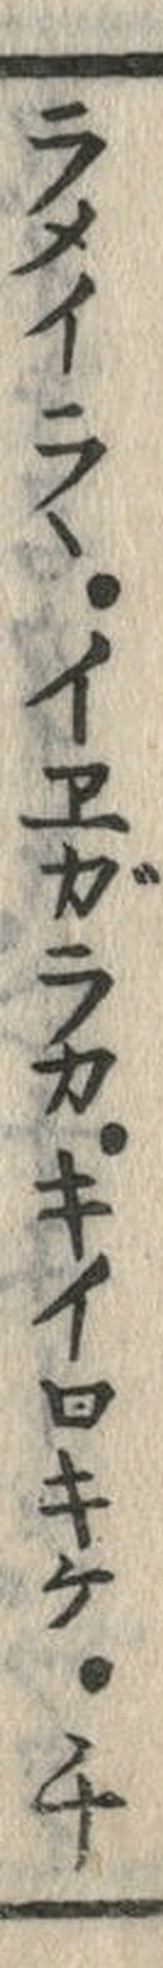ラメイラヽ。イヱガラカ。キイロキケ。チ
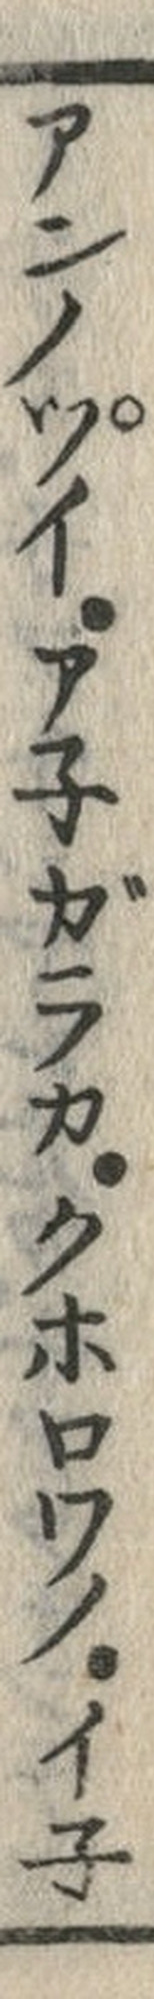アンノツ゚イ。アネガラカ。クホロワノ。イネ

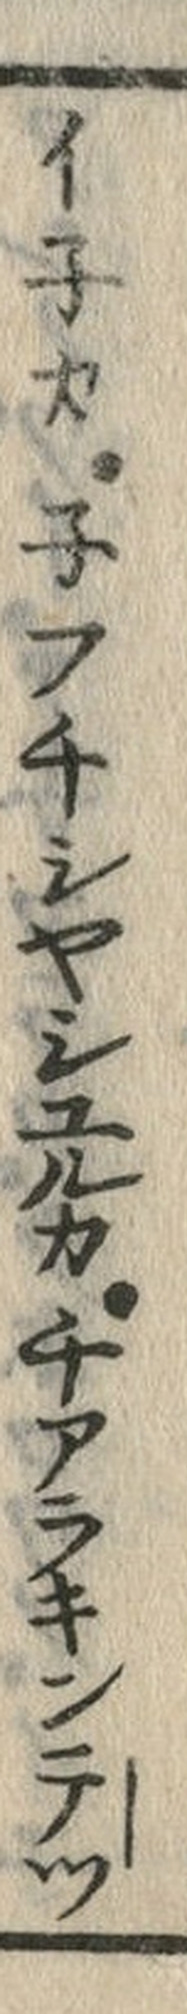イネカ。ネフチシヤシユルカ。チアラキンテツ
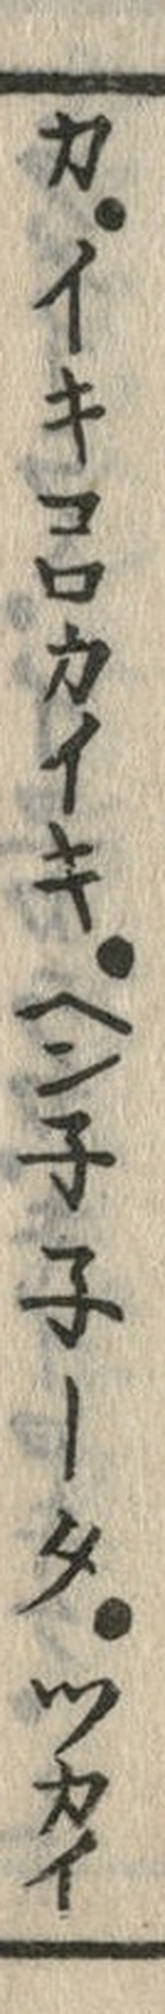カ。イキコロカイキ。ヘンネネータ。ツカイ
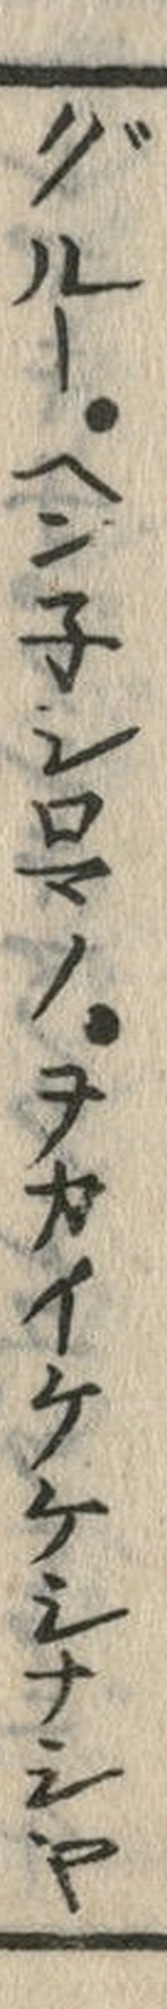グルー。ヘンネシロマノ。ヲカイケツシナシヤ
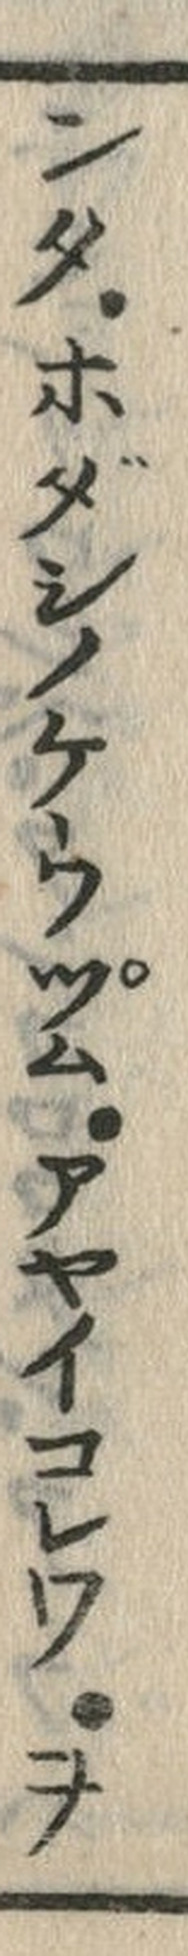ンタ。ホダシノケウツ゚ム。アヤイコレワ。ヲ
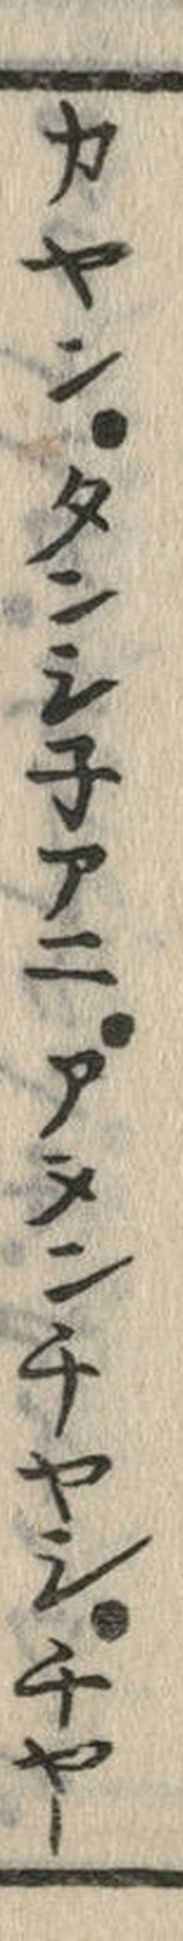カヤン。タンシネアニ。アヌンチヤシ。チヤー
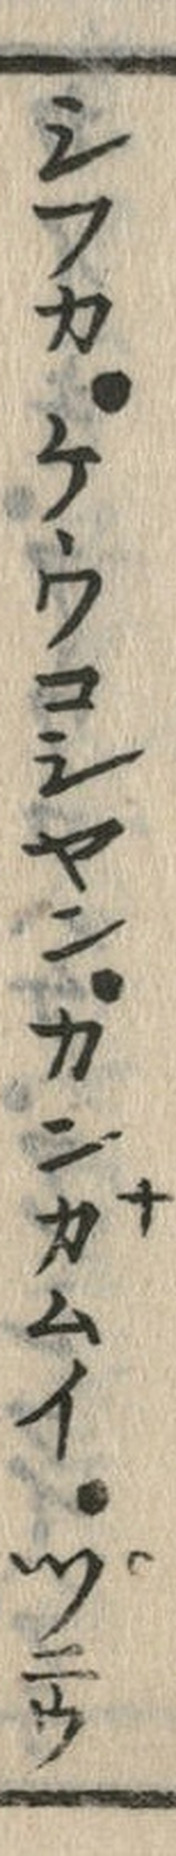シフカ。ケウコシヤン。カンナカムイ。ツ゚ニウ
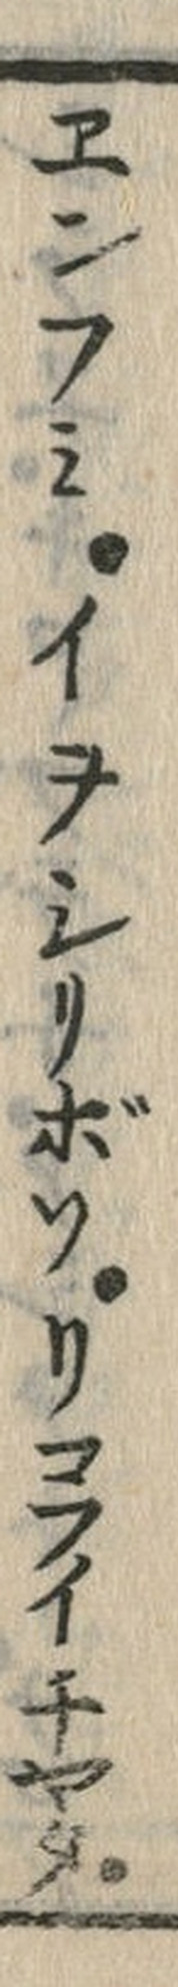ヱンフミ。イヲシリボソ。リコフイチヤタ。
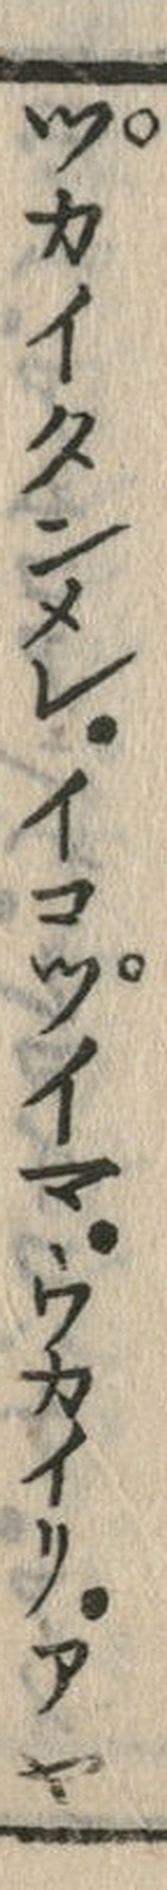ツ゚カイタンメレ。イコツ゚イマ。ウカイリ。アヤ

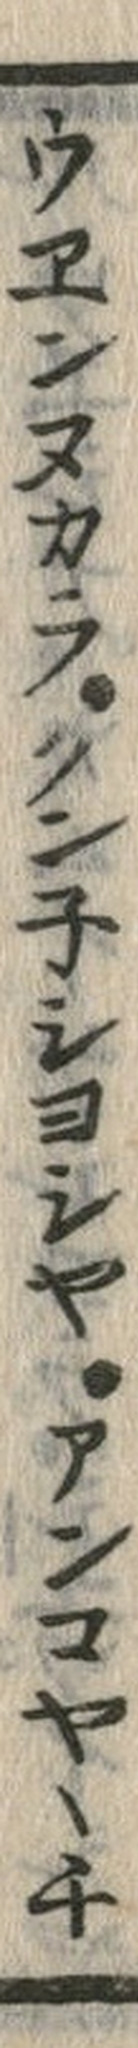ウヱンヌカラ。クンネシヨシヤ。アンコヤヽチ
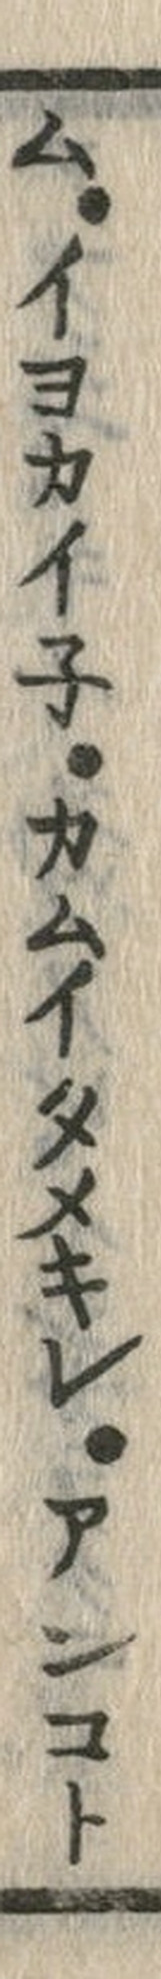ム。イヨカイネ。カムイタメキレ。アンコト
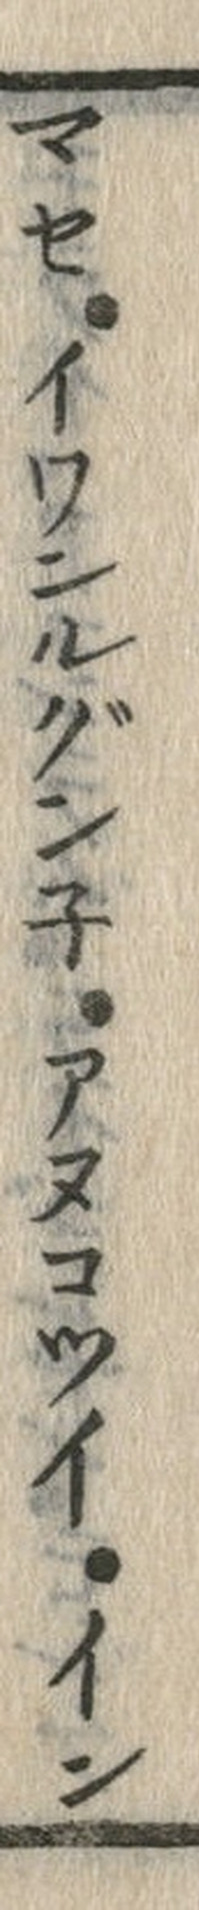マセ。イワンルグンネ。アヌコツイ。イン
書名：蝦夷方言藻汐草　坤巻
